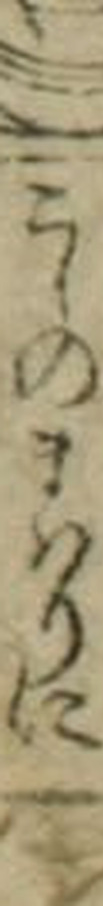こしのまはりに
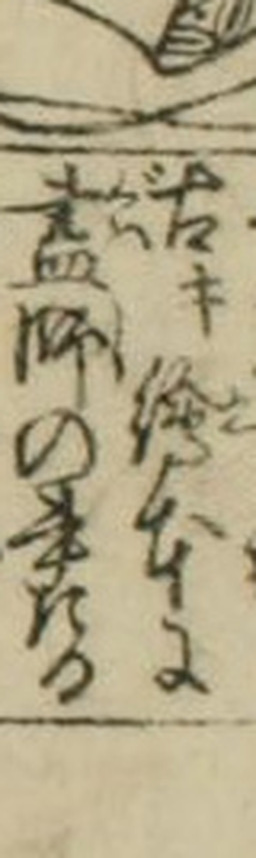畫師の書たる
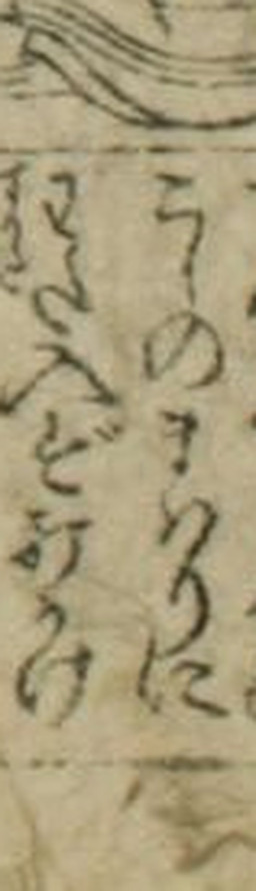わた入ず打かけ
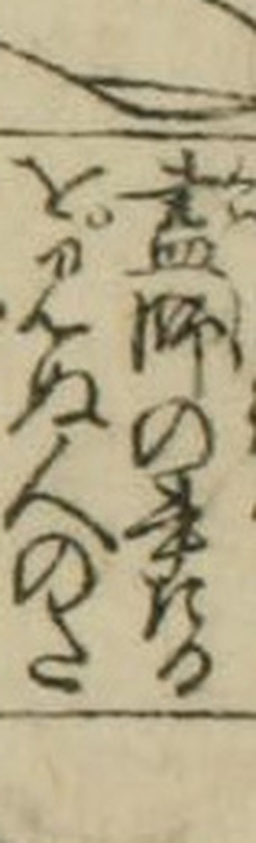を。見ぬ人のた
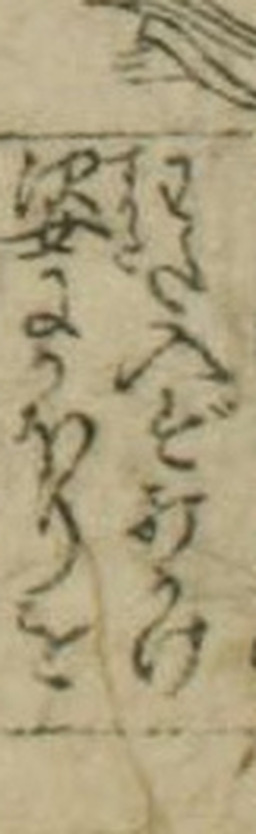姿にかほりを
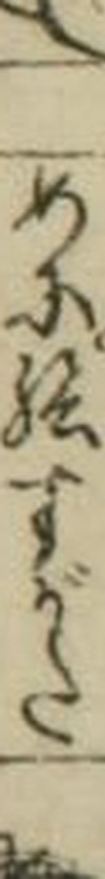めに。絵すがた
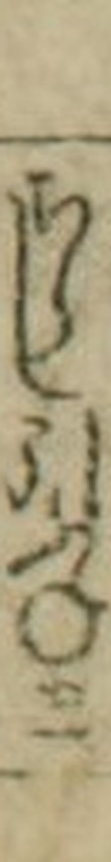ちらし引ふねと
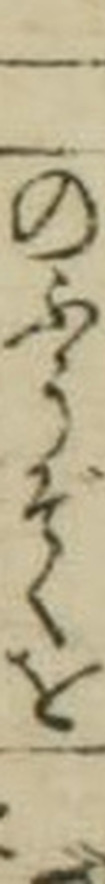のふうぞくを
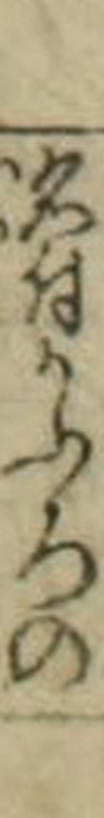名付かふろの
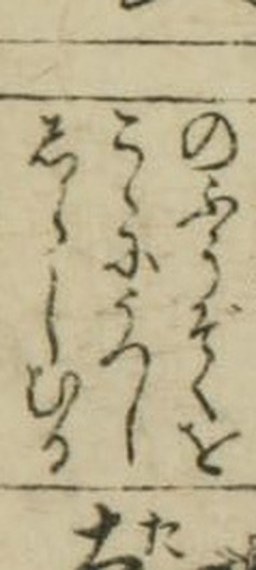こゝにうつし
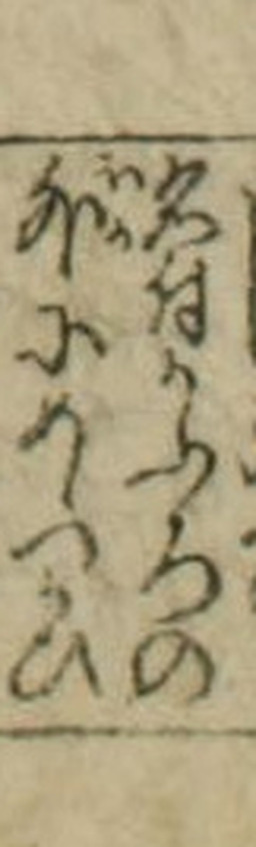外にめしつかひ
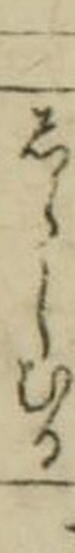しらしむる
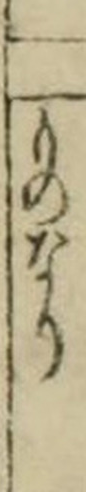ものなり
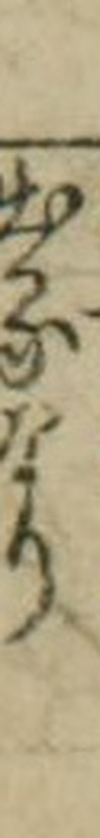出るなり
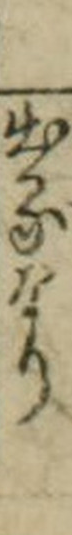出るなり
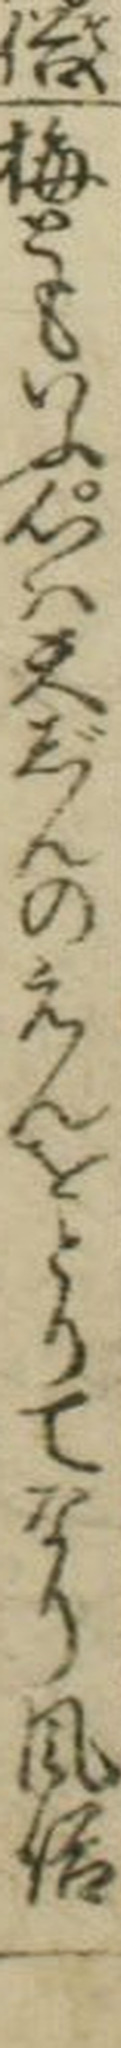梅ともいふ。心は天じんのえんをとりてなり風俗
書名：女源氏教訓鑑
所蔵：東京学芸大学附属図書館
